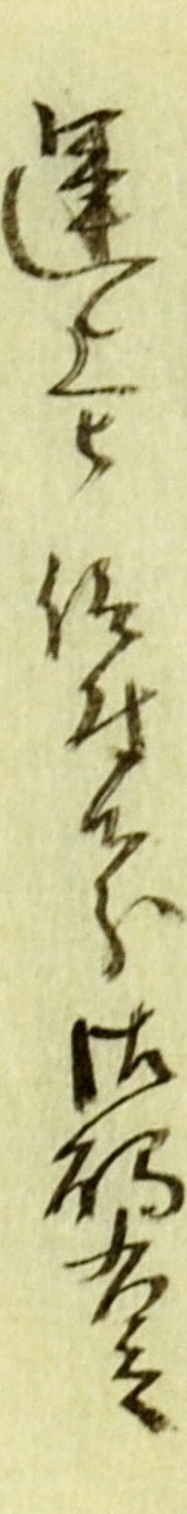運上被仰付候分御触有之
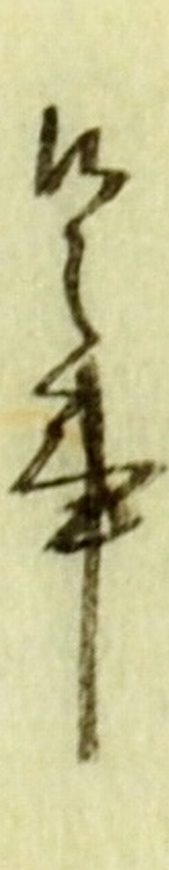候之事
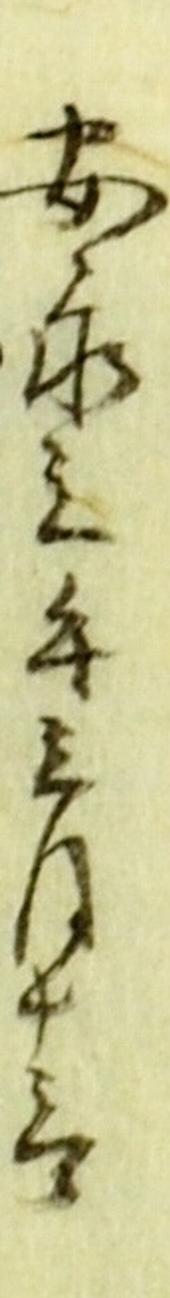安永三午三月十三日
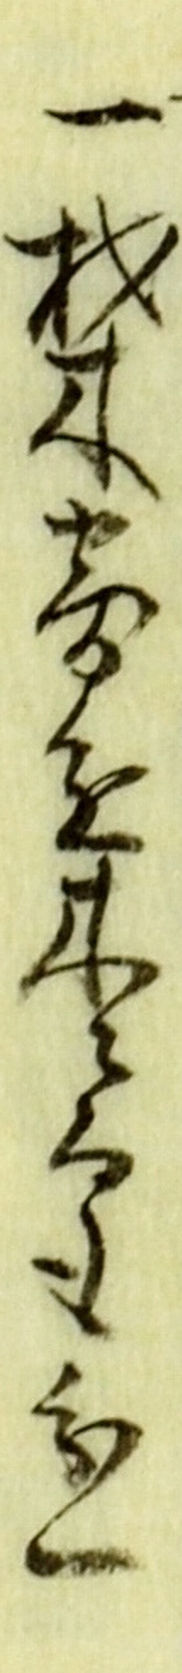一材木寄進木ニ而も分一
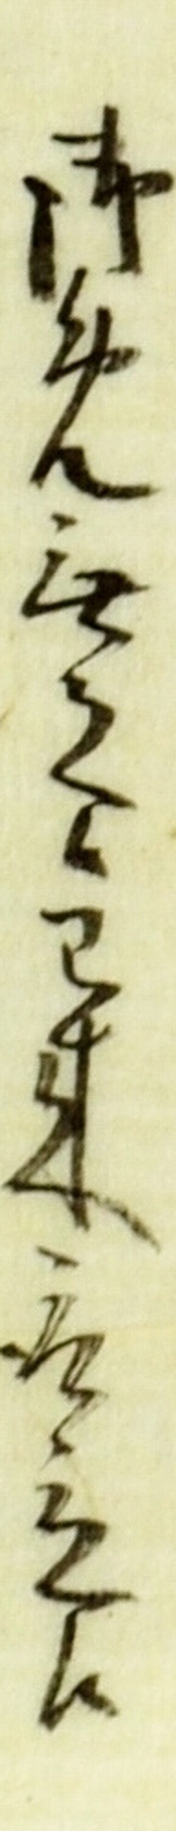御免無之候已来取立候
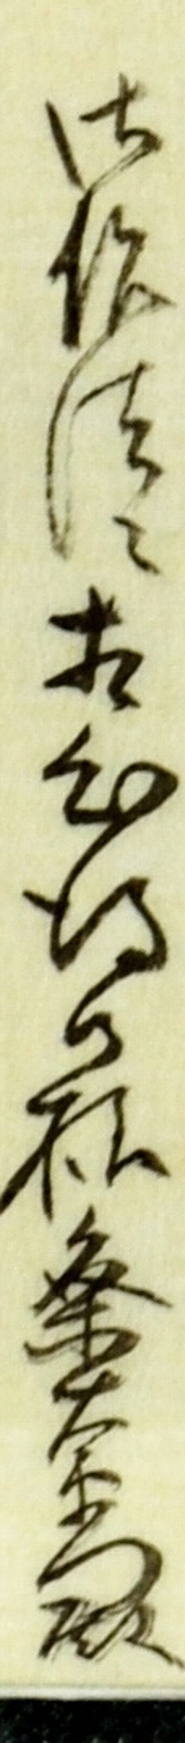御作法ニ相心得候様粂右衛門殿
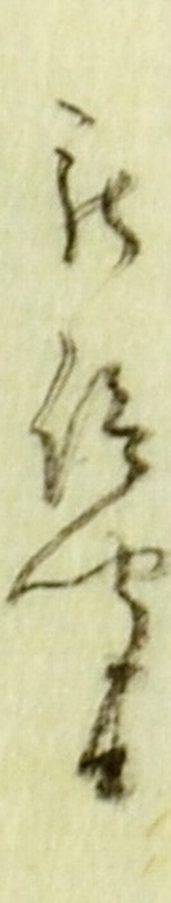被仰聞候
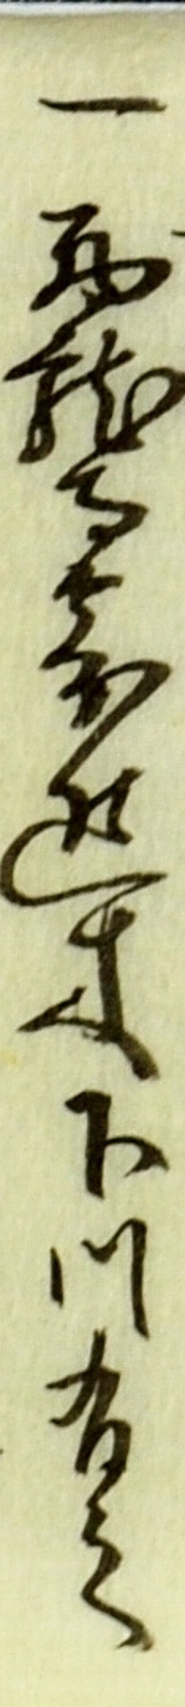一西龍寺之分近来下川有之
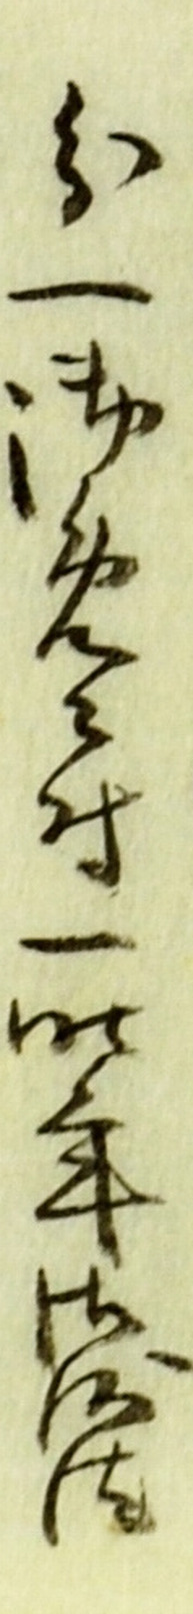分一御免ニ付一昨年御沙汰
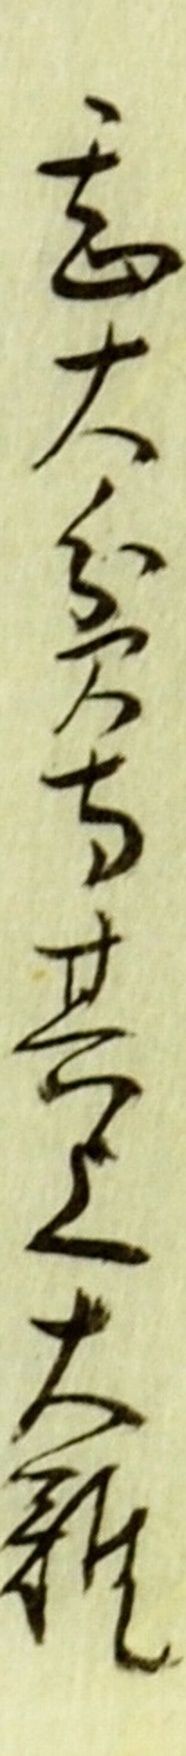甚大分間寺其上大難
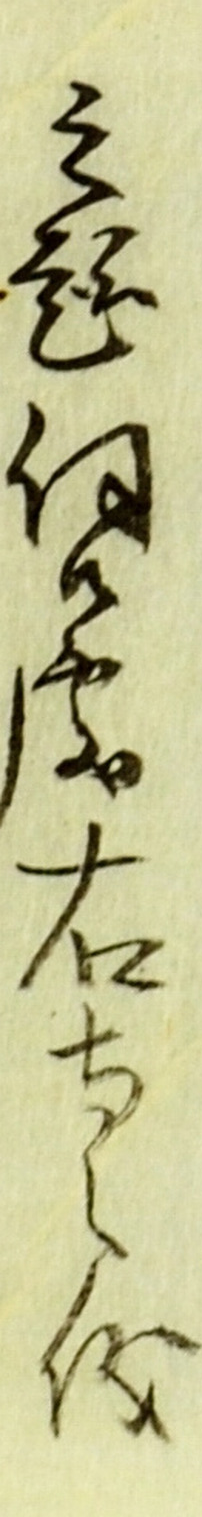之趣伺候処右寺之儀
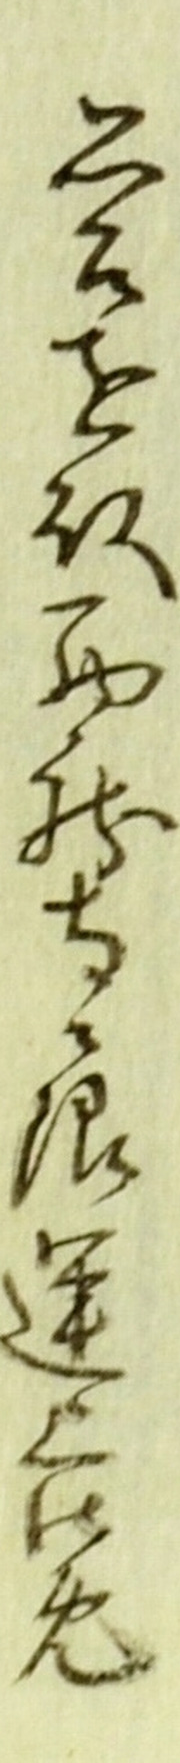思召を以西龍寺ニ限運上御免
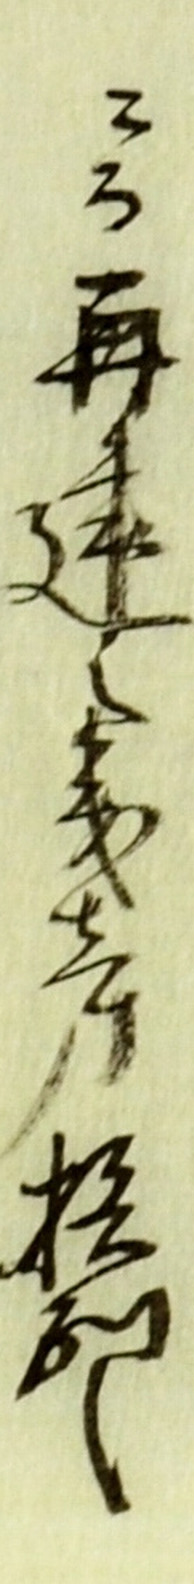ニ而再建之義旁格別之
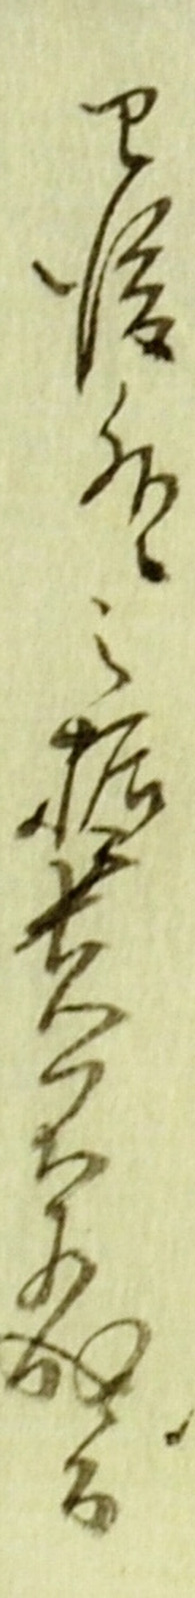申候後外ニ之振者不相成ニ而
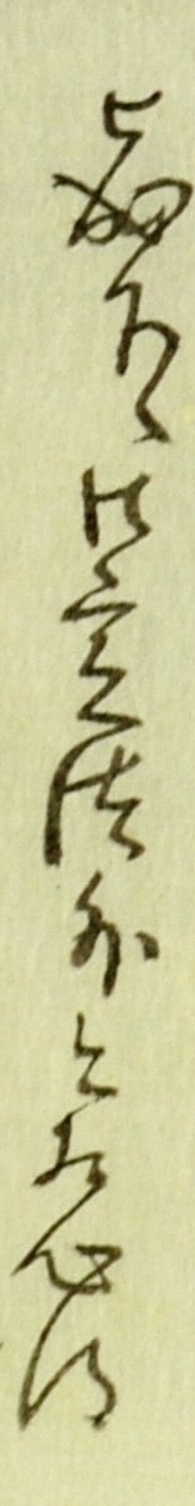被成下候御定法外者相心得
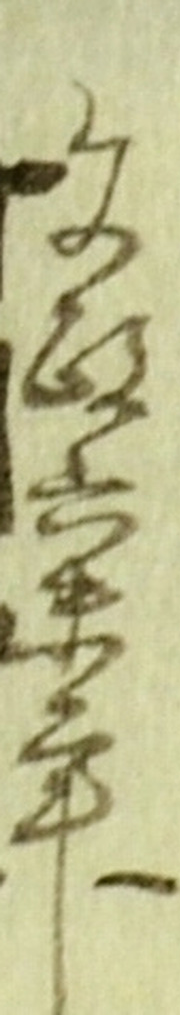文政六未年
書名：分一御定法
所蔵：伊那市立高遠町図書館・合同会社AMANE
